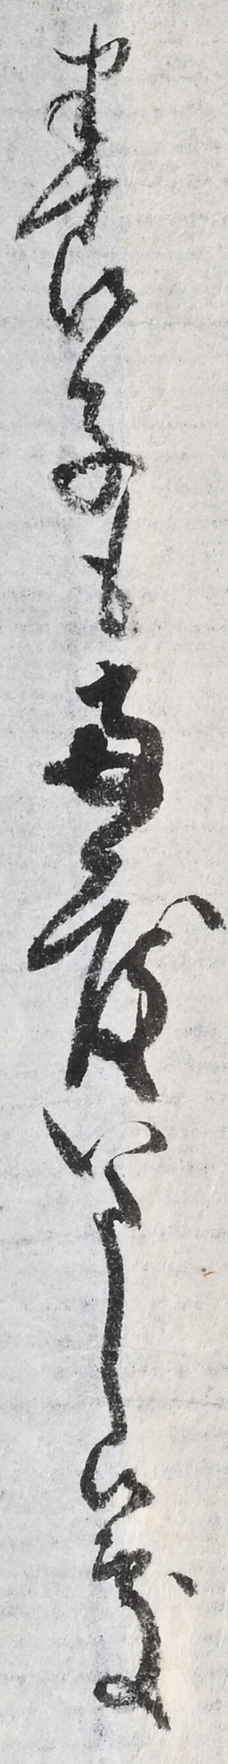養子も両度いたし候処
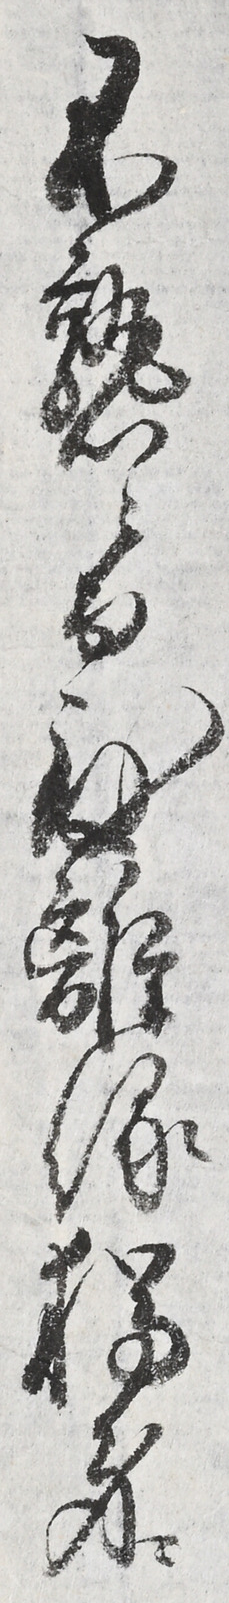不熟ニ而致離縁独身ニ
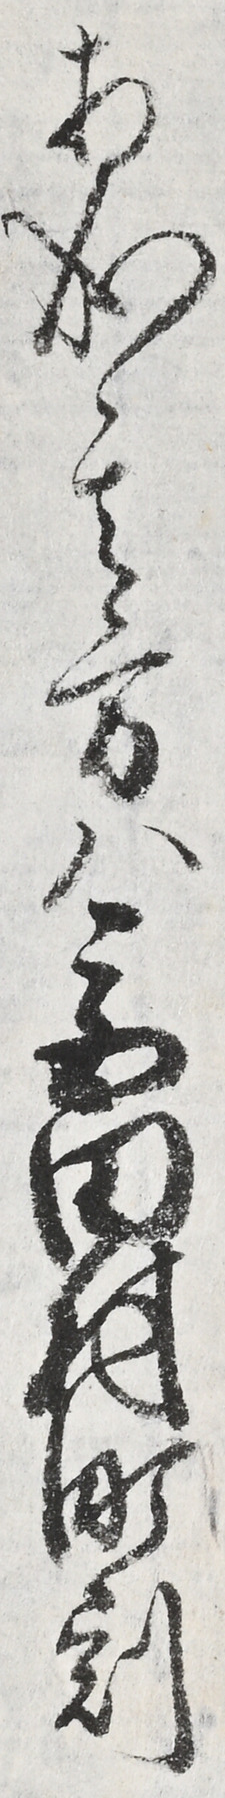相成其方ハ宮田村町割
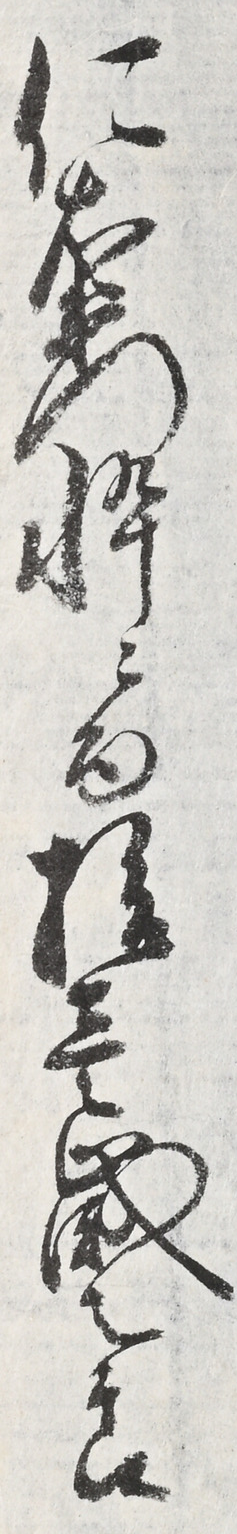仁右衛門悴ニ而拾壱歳之節
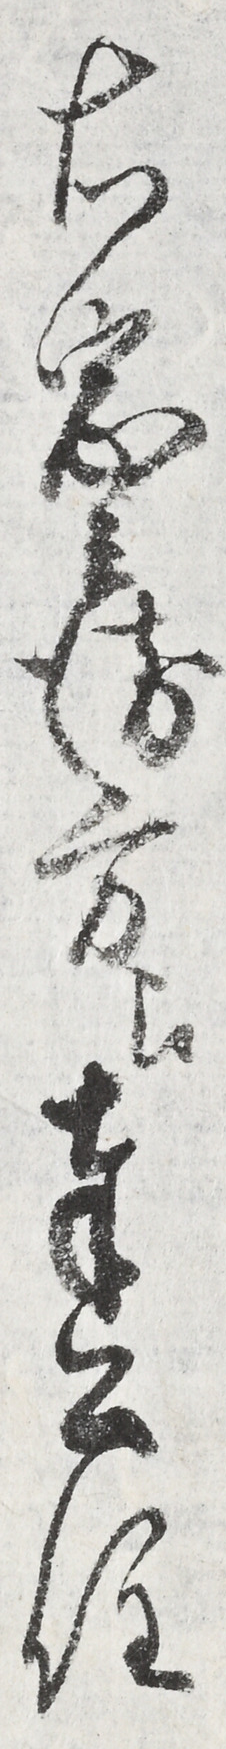右忠兵衛方え奉公住
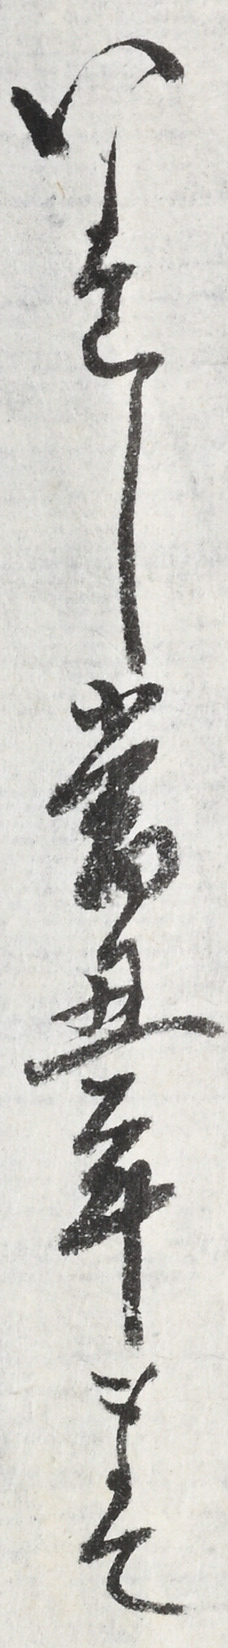いたし当丑年まて

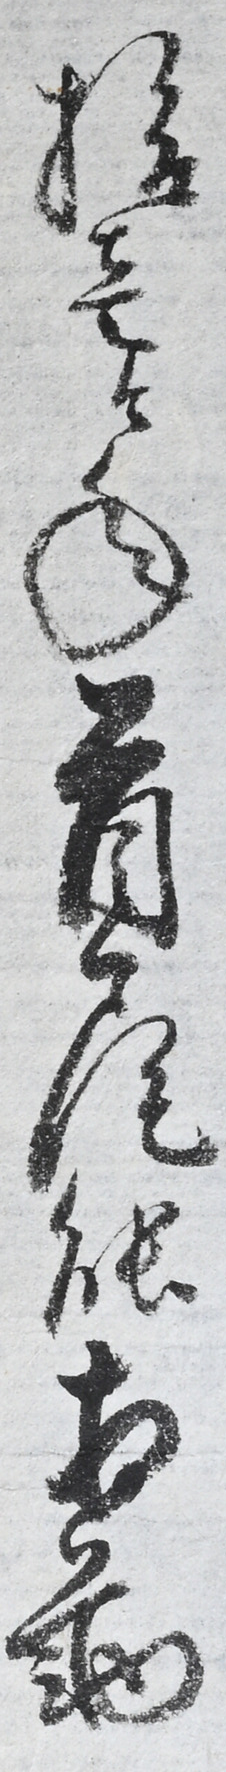拾壱ヶ年首尾能相勤
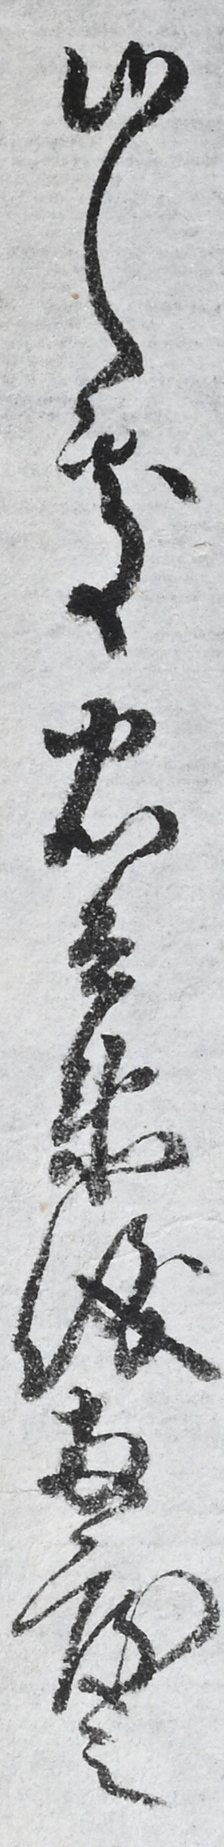候之処忠兵衛儀両度之
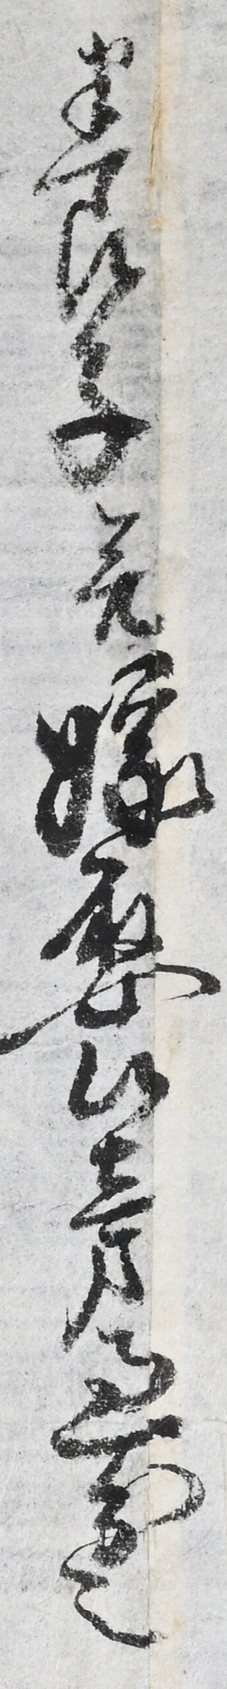養子幷嫁娶候旁過分之
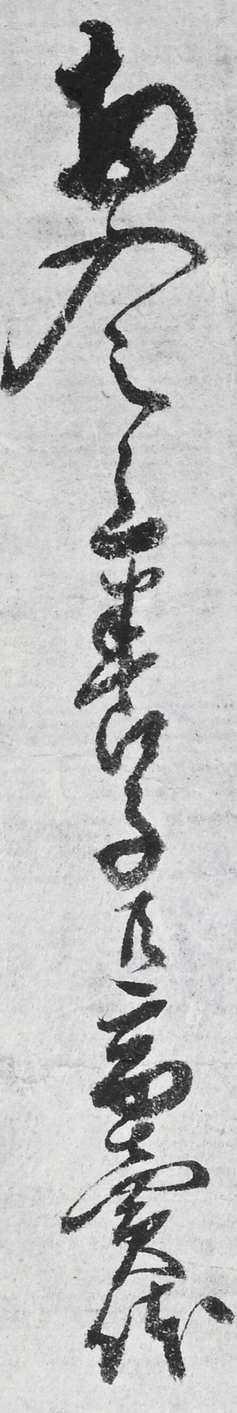物入之上養子共商売体
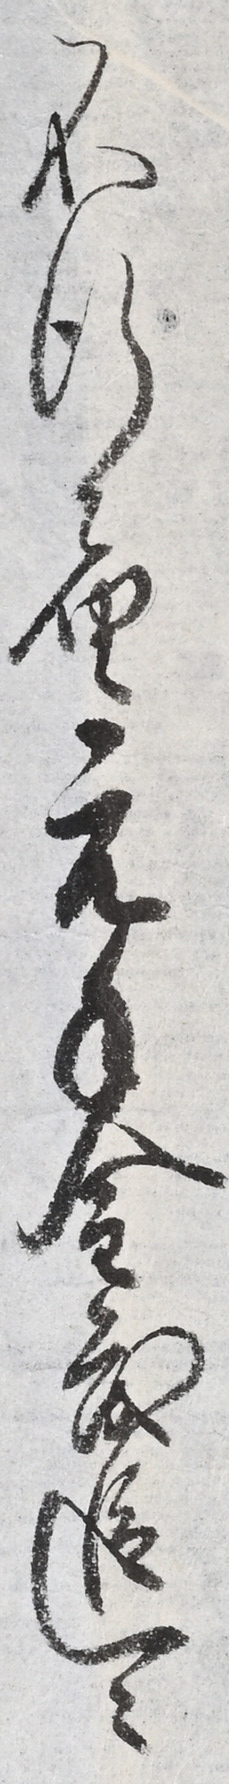不行届元手金も追々
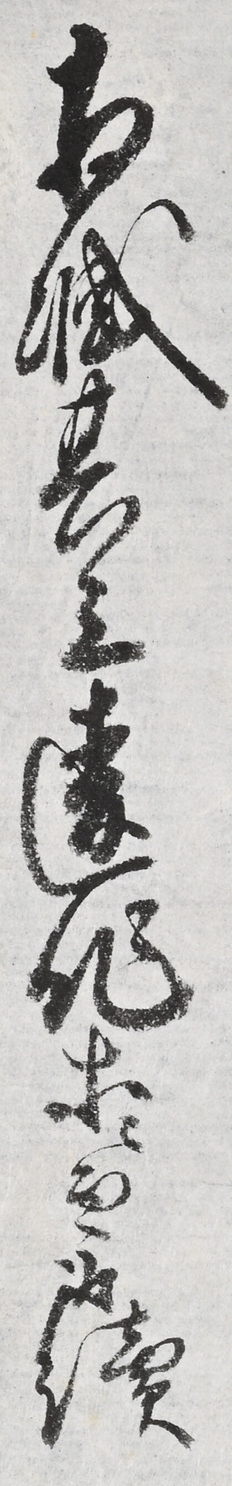相減其上違作等ニ而取続
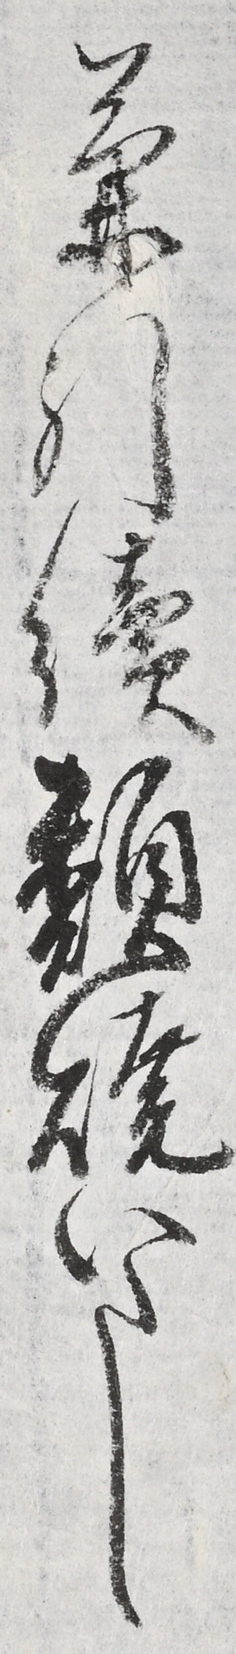兼引続類焼いたし
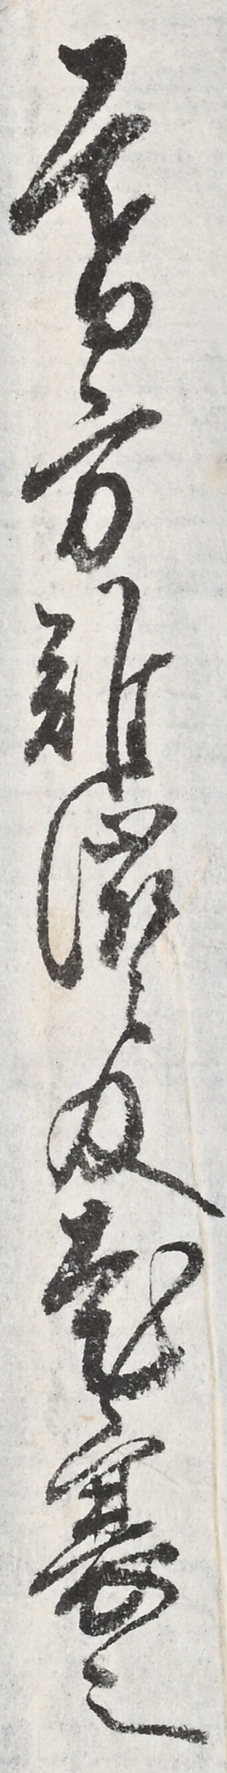暮方難渋ニ及老衰之
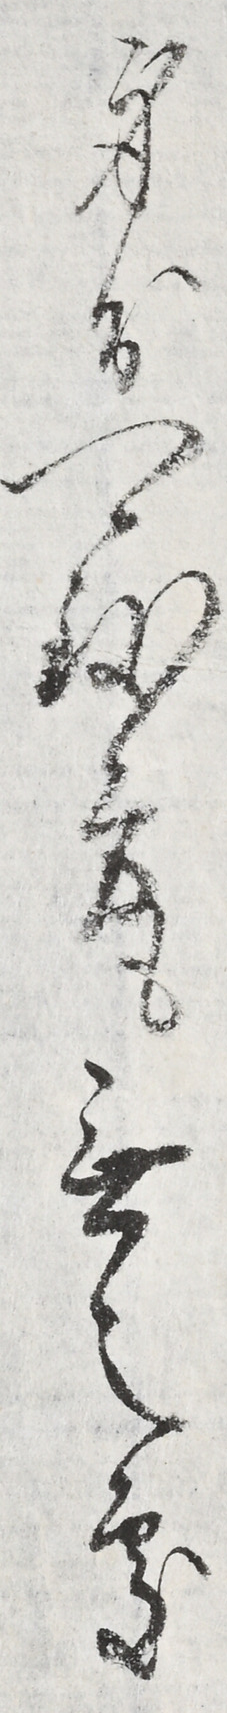身分可致方も無之処
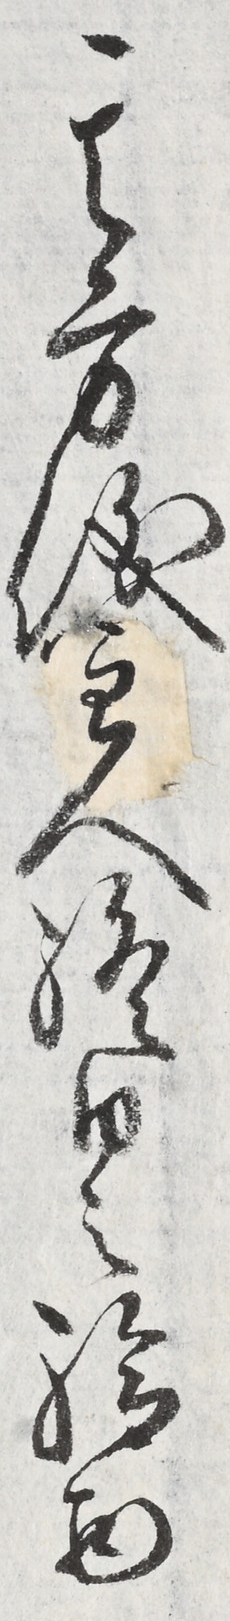其方儀主人終日之給物
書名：（書付）
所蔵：伊那市立高遠町図書館・合同会社AMANE
